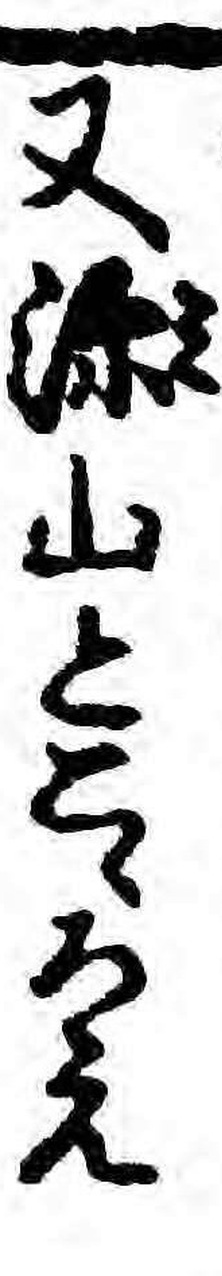又深山とこゝろえ
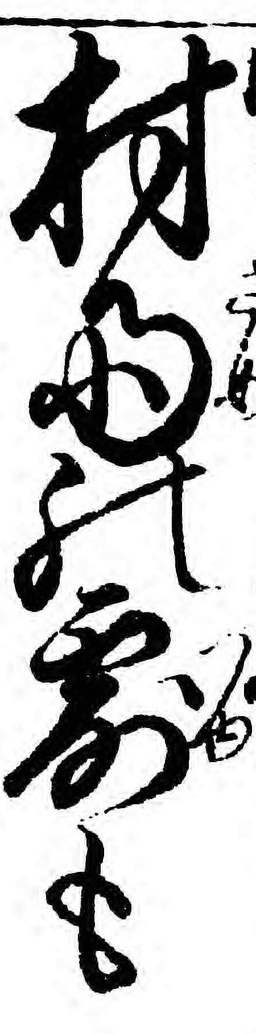村雨の露も
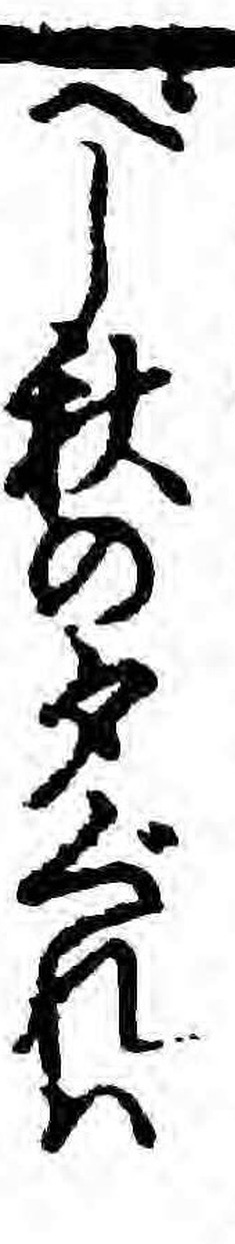べし秋の夕ぐれには
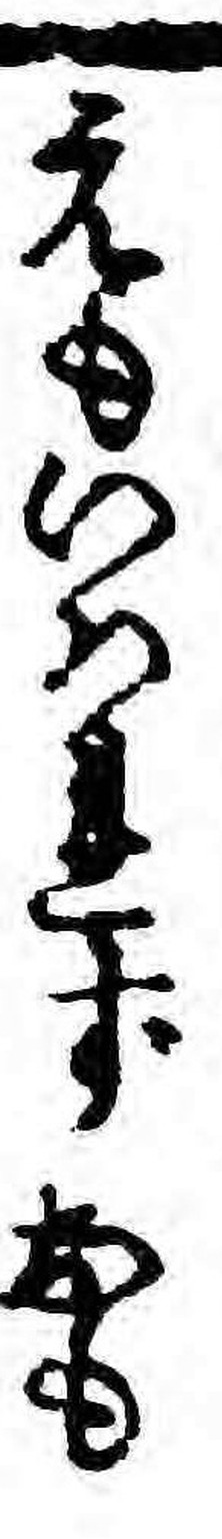えもいはれずおも
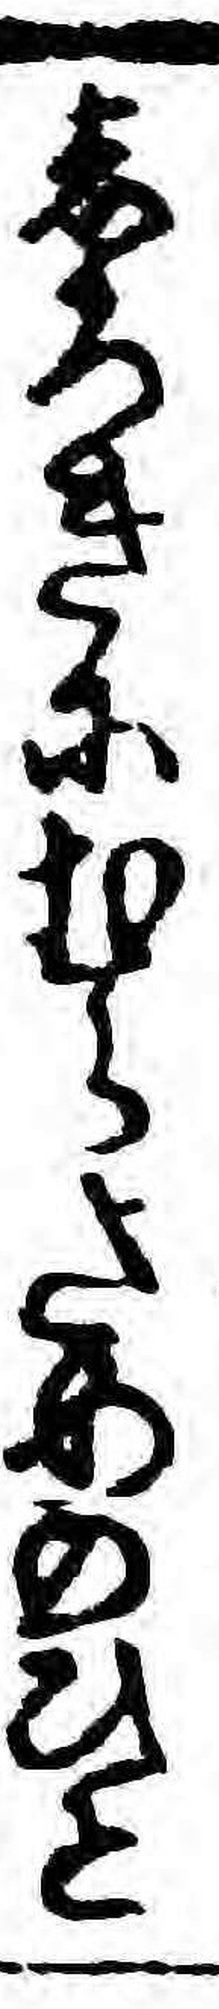しろきにむらさめのひと
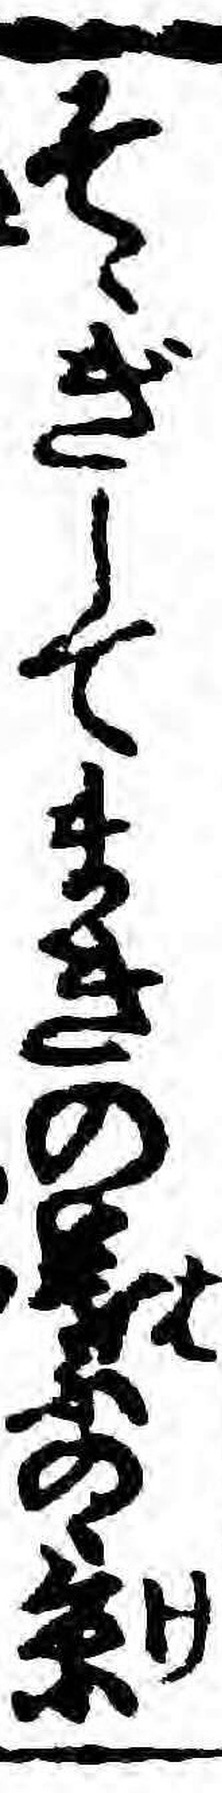そゝぎしてまきの葉の景
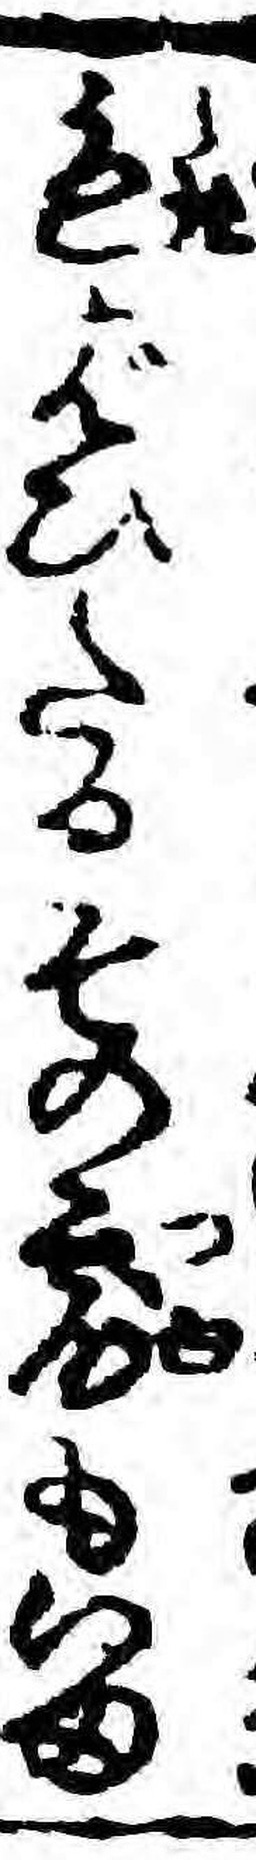色ばひたるその露もいま
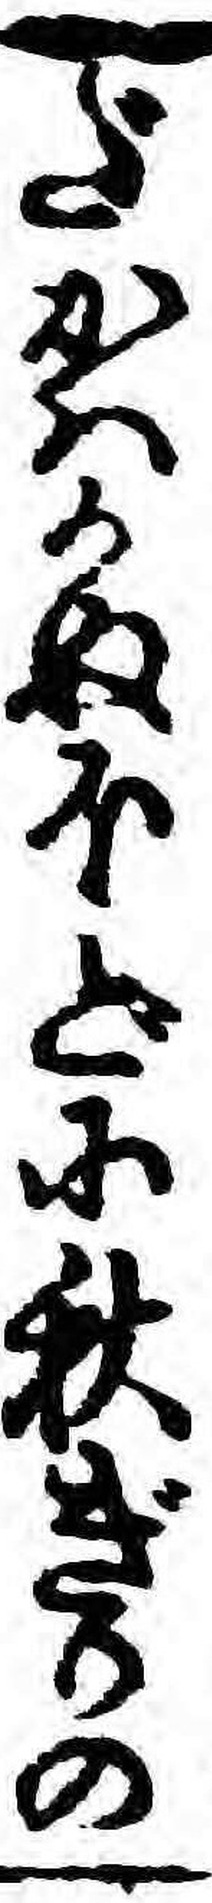だかはかぬほどに秋ぎりの
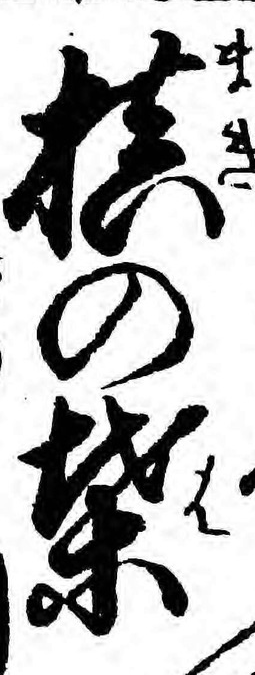槇の葉
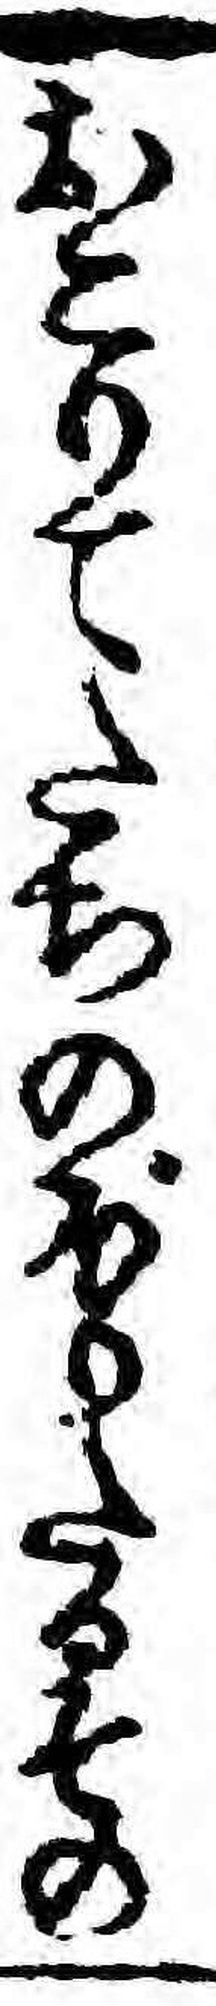おこりてたちのぼりたるその
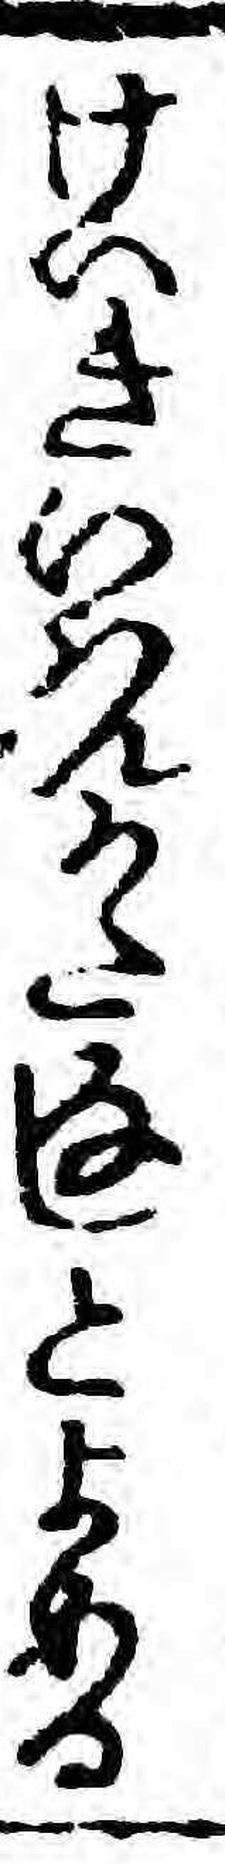けいきいはんかたなしとよめる
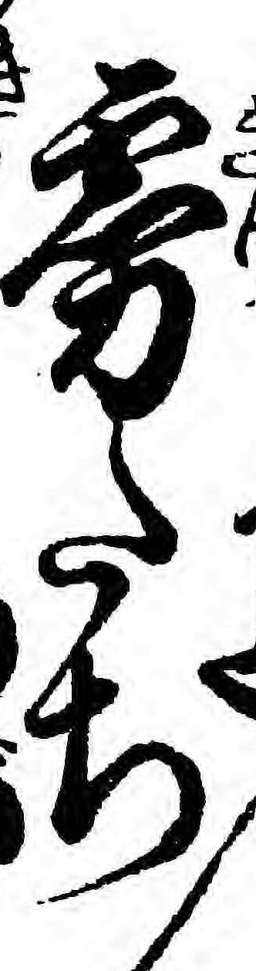霧たち
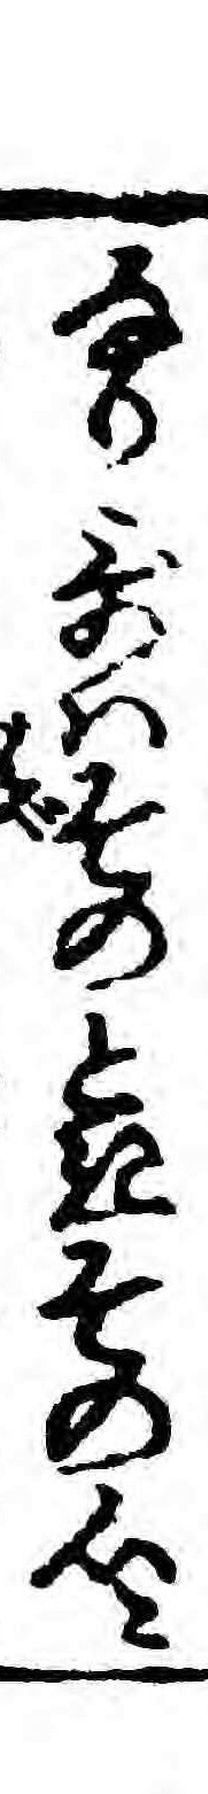なり哥はそのときその心に
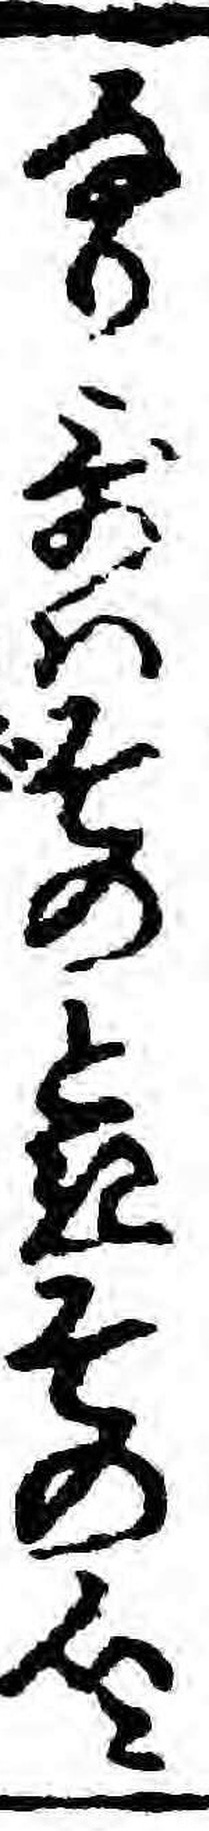なり哥はそのときその心に
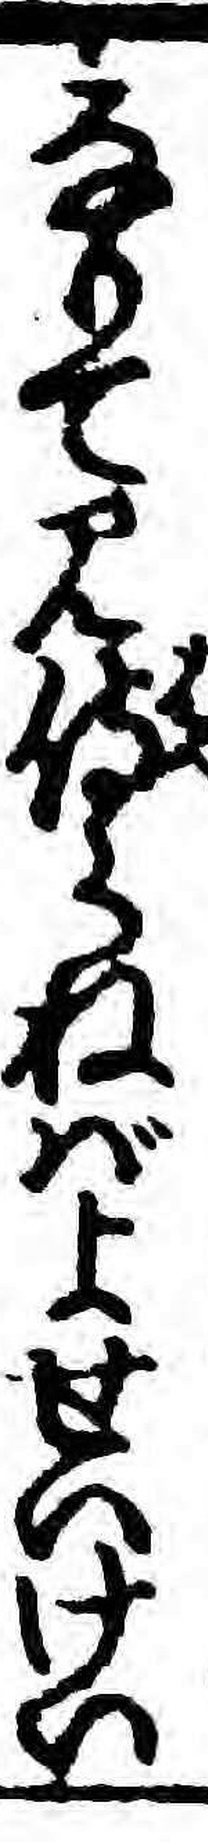なりて見侍らねばよせいけい
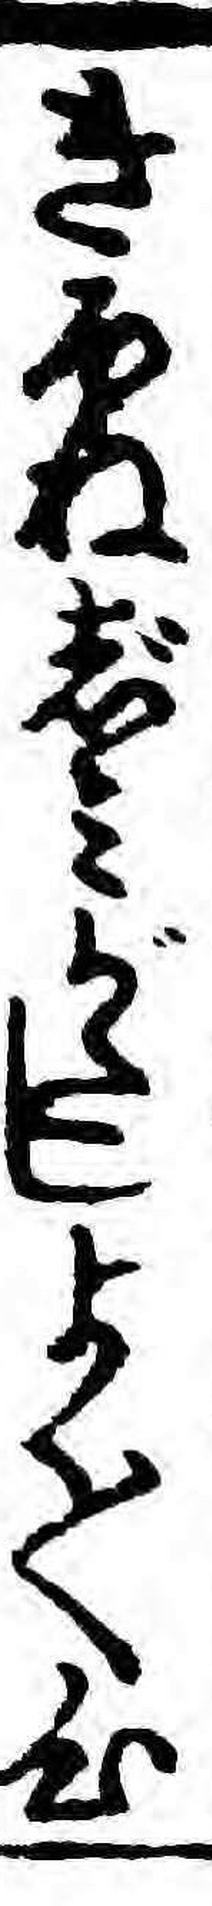きほねじみがたしよく〳〵心
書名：頭書和歌注譯／壽賀多百人一首小倉錦
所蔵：国文学研究資料館
